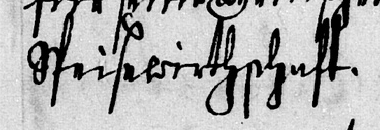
Speisewirthschaft.
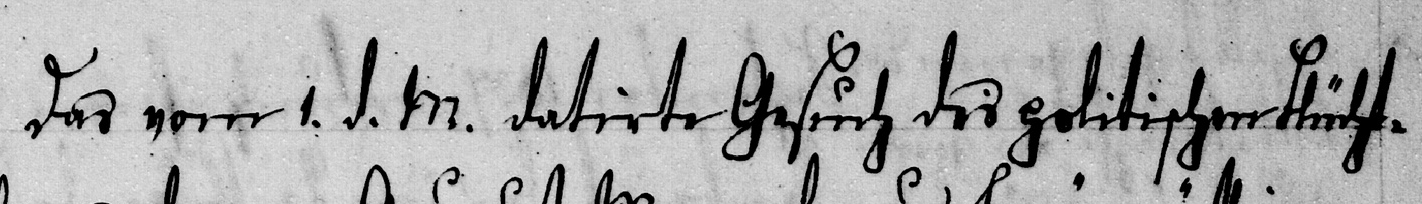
Das vom 1. d. M. datirte Gesuch des politischen Flüch¬
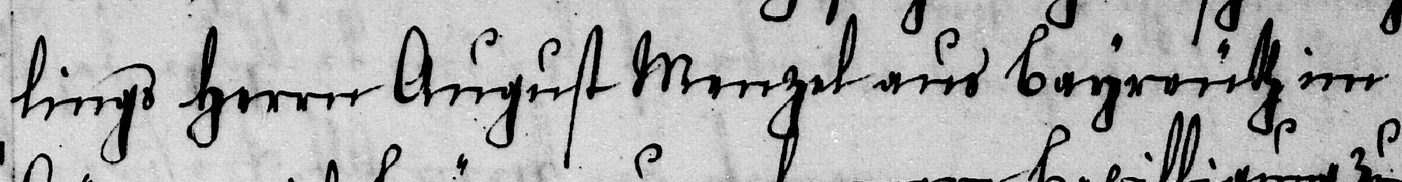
tlings Herrn August Menzel aus Bayreuth im
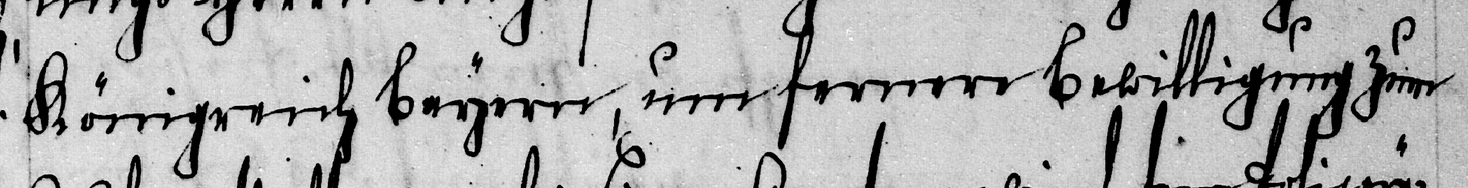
Königreich Bayern, um fernere Bewilligung zum
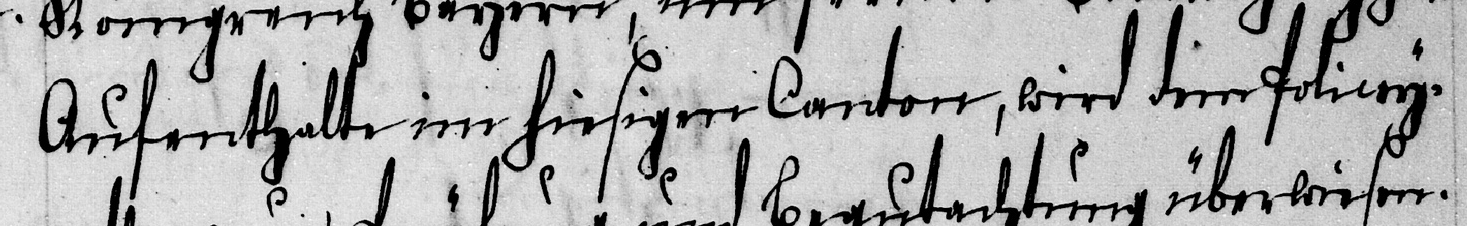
Aufenthalte im hiesigen Canton, wird dem Policey¬
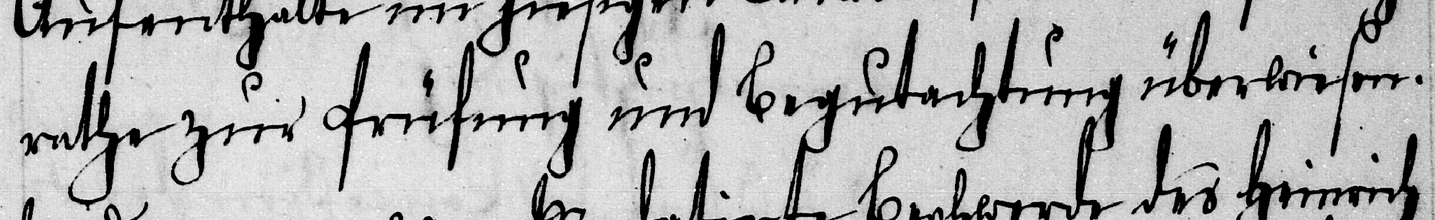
rathe zur Prüfung und Begutachtung überwiesen.
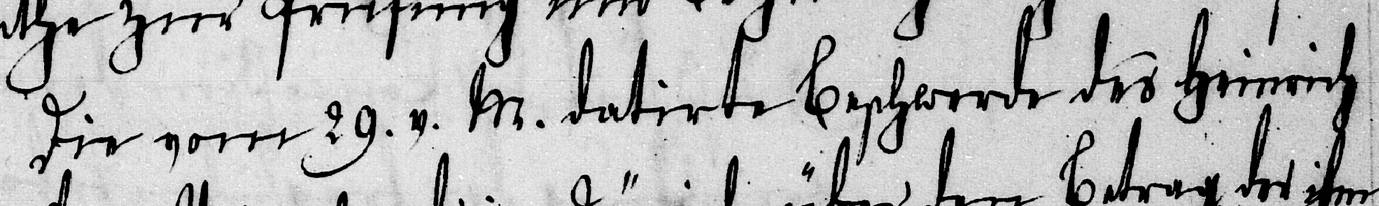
Die vom 29. v. M. datirte Beschwerde des Heinrich
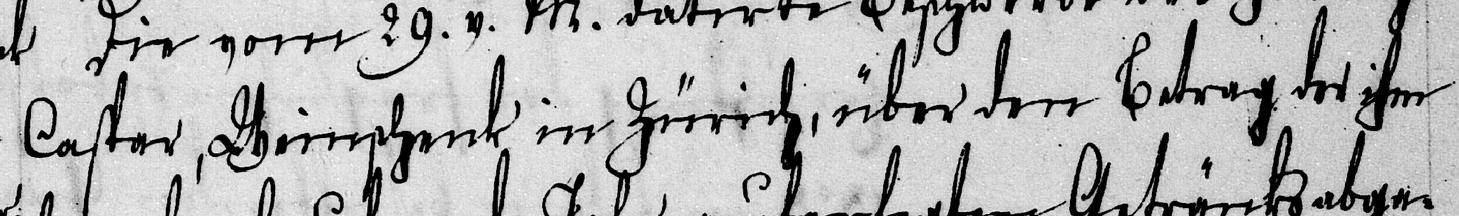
Caspar, Weinschenk in Zürich, über den Betrag der ihm
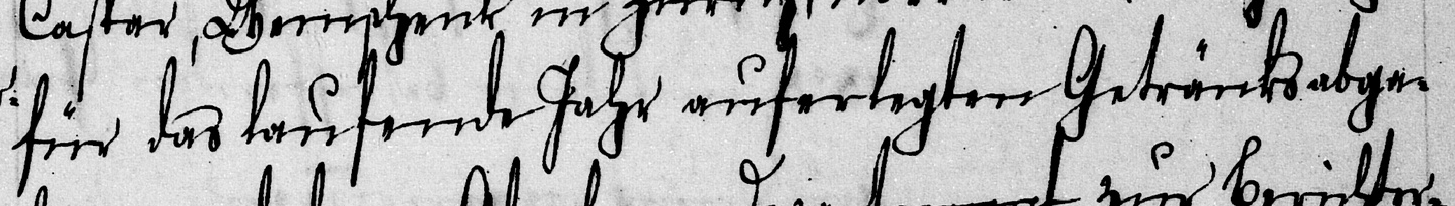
für das laufende Jahr auferlegten Getränksabga¬
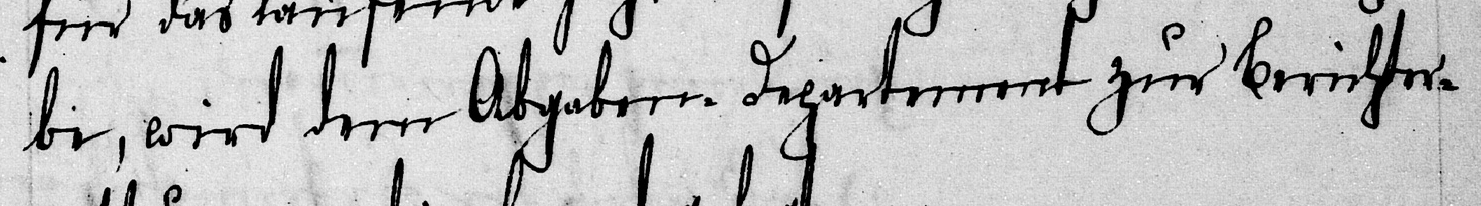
be, wird dem Abgaben-Departement zur Berichters¬
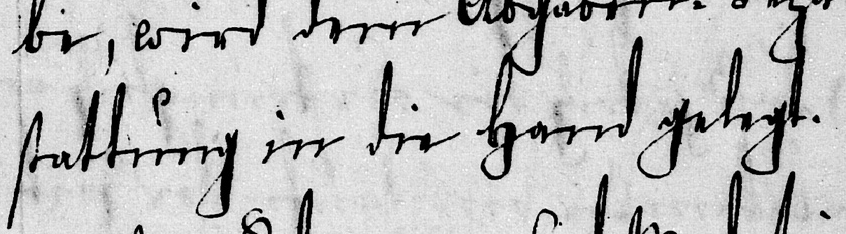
tattung in die Hand gelegt.
